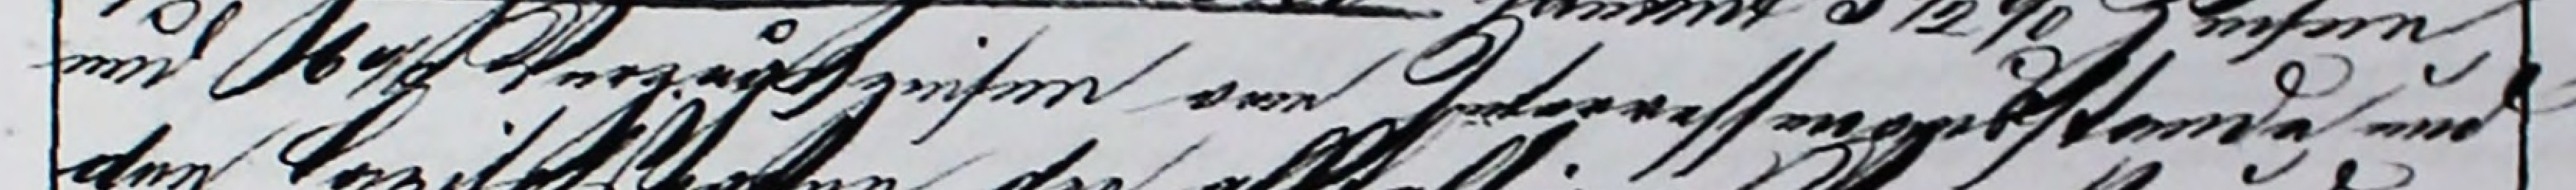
und 6 % Verzugszinsen von ???ressengutstande und
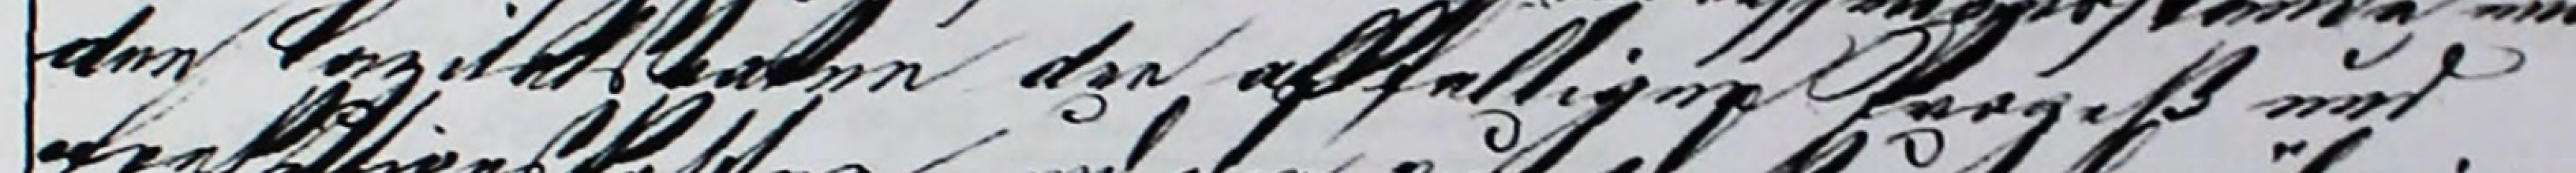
der Kapitals?a??en den a??falligen Prageß und
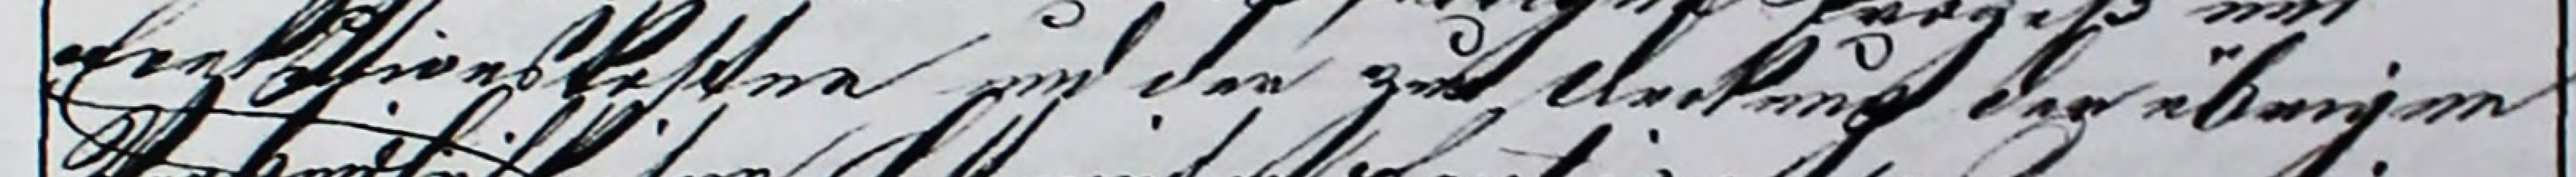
Executionskasten und der zur Verkung der übrigen
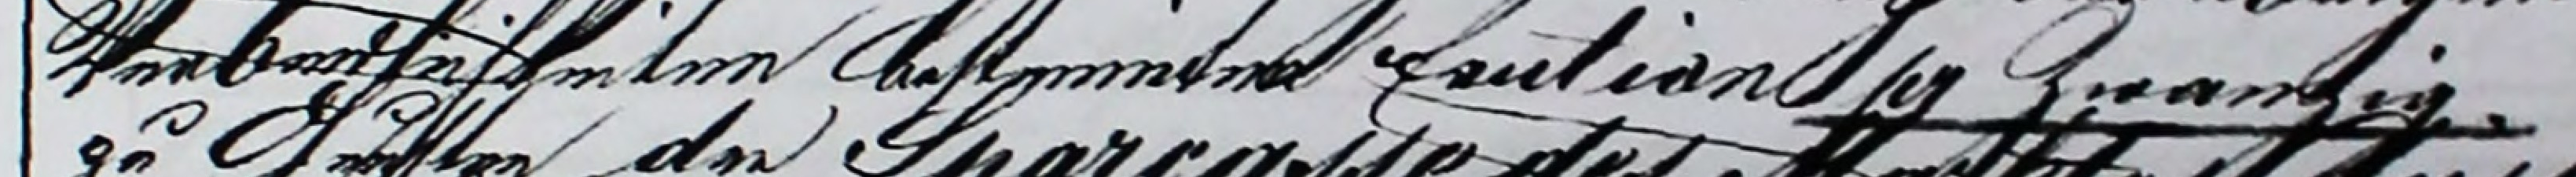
Verbindlichkeiten Bestimmten Caution 19 Zwanzig
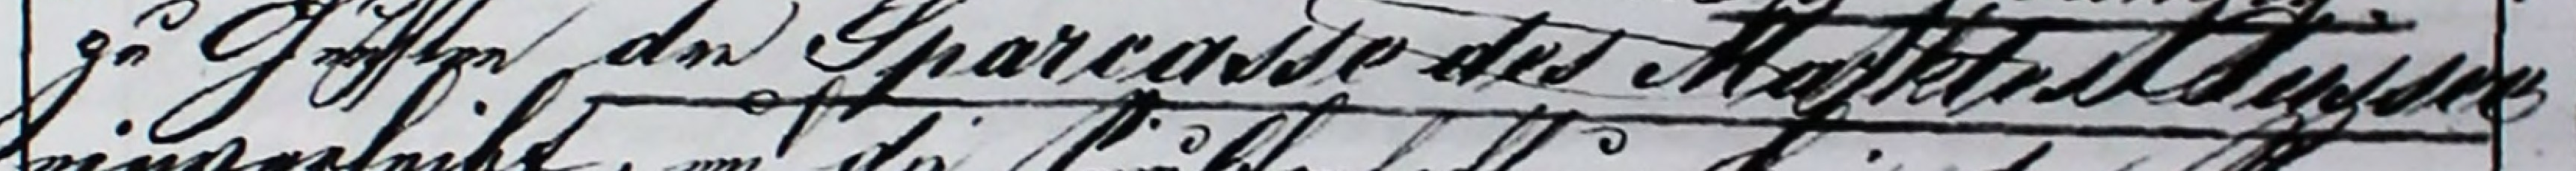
zu Gunsten der Sparcasse des Marktes Altaussee
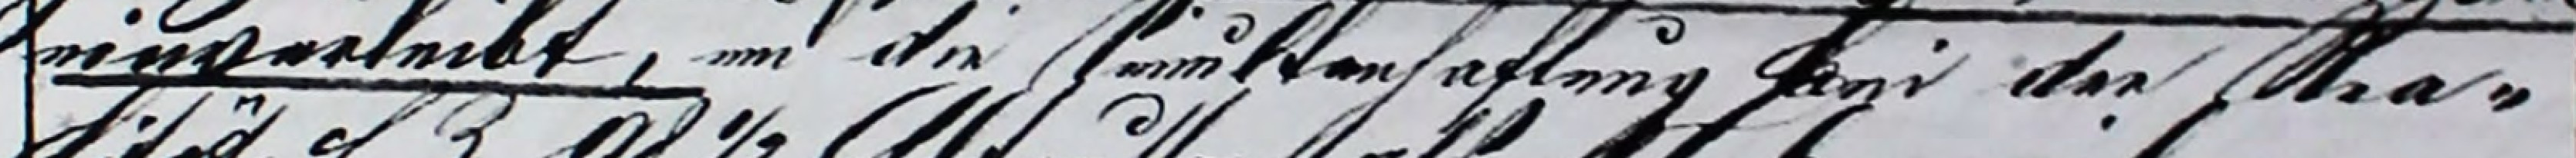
einverleibt, und die Simultanhaftung bei der Rea„
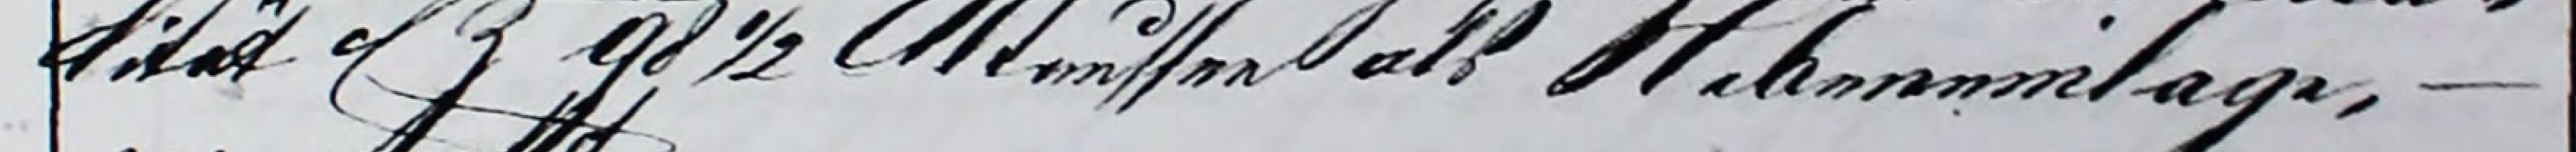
lität E Z 98 1/2 Altaussee als Nebeneinlage, -
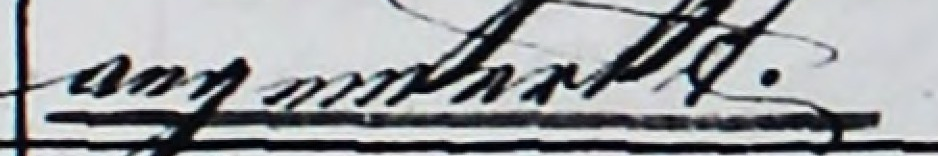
angemerkt.
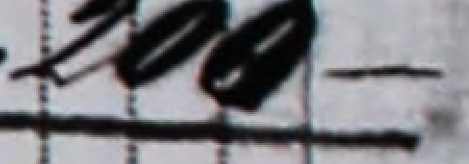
200 –
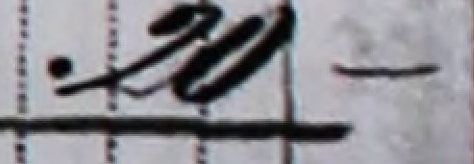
20 –
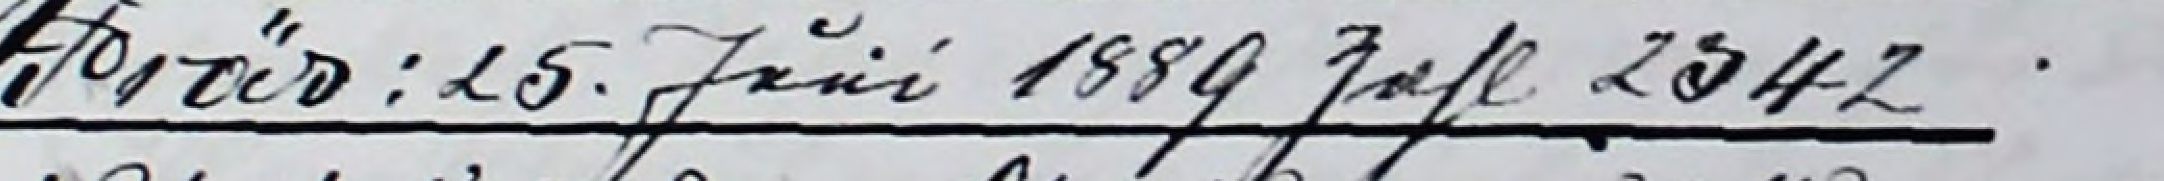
Präs: 15 Juni 1889 Zahl 2342
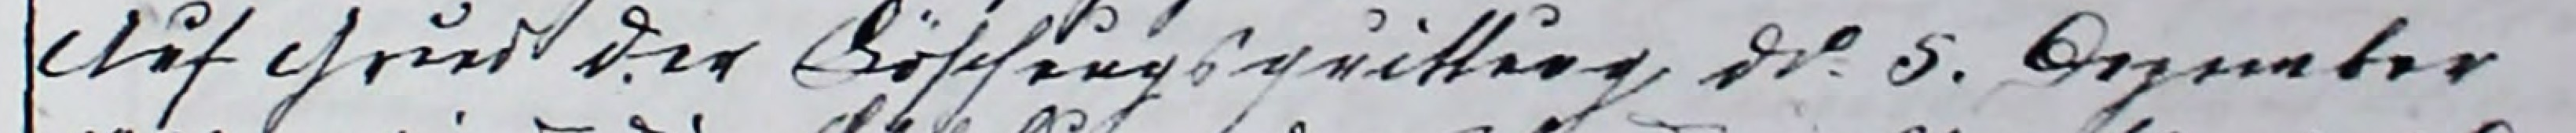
Auf Grund der Löschungsquittung ddo 5. Dezember
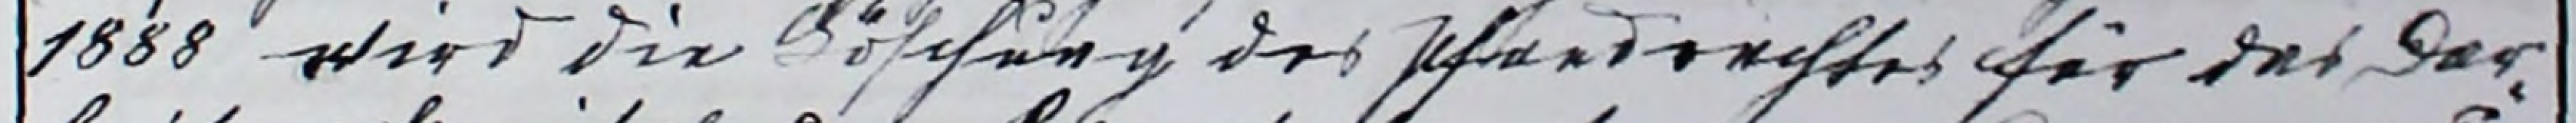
1888 wird die Löschung des Pfandrechtes für das Da„
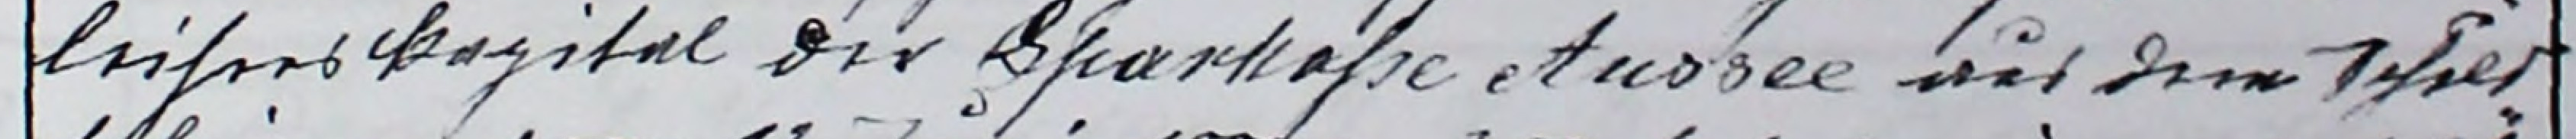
leihenskapital der Sparkasse Aussee aus dem Schuld
